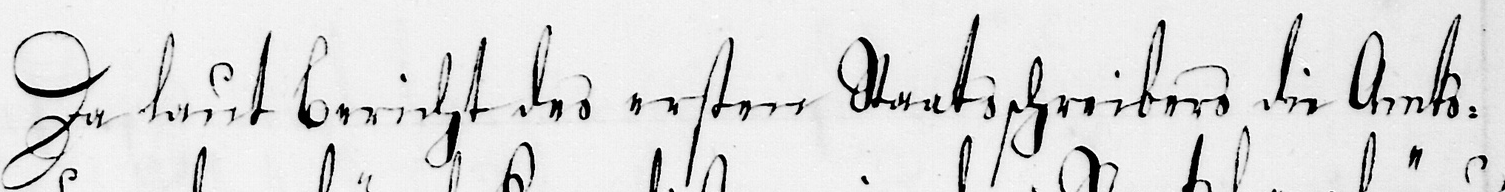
Da laut Bericht des ersten Staatsschreibers die Amts¬
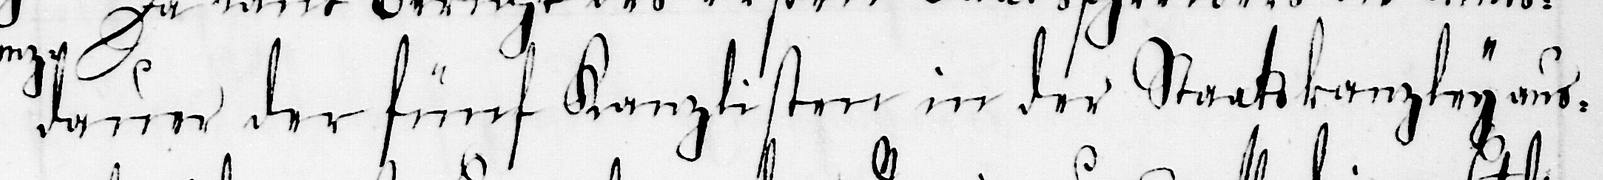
dauer der fünf Kanzlisten in der Staatskanzley aus¬
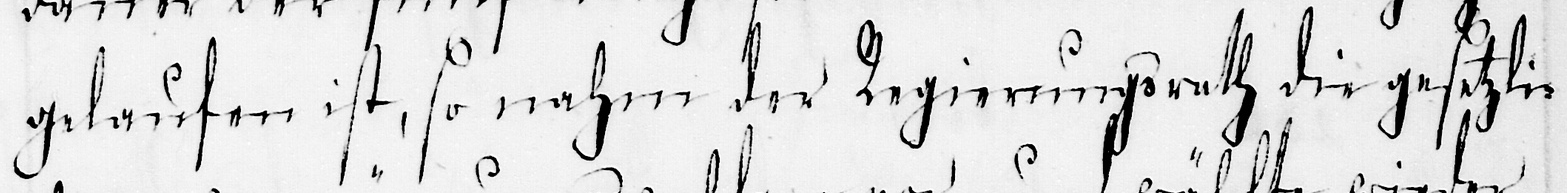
gelaufen ist, so nahm der Regierungsrath die gesetzli¬
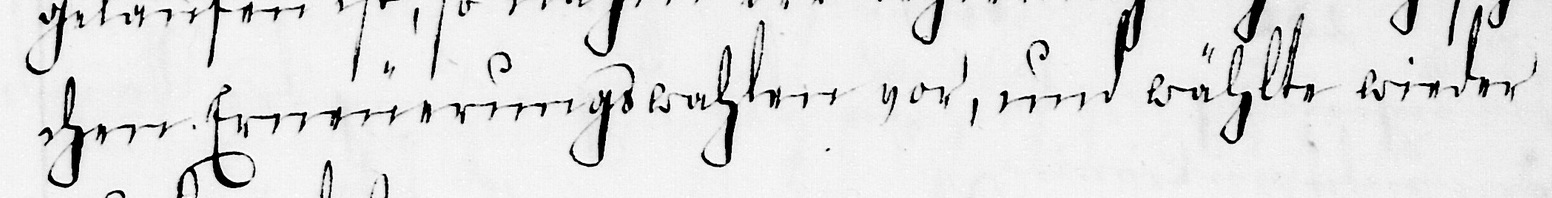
chen Erneuerungswahlen vor, und wählte wieder
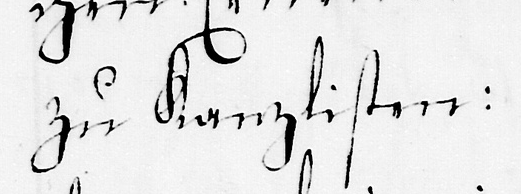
zu Kanzlisten:
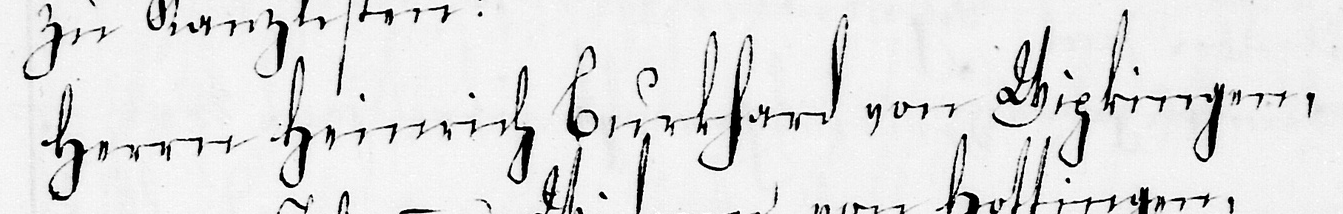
Herrn Heinrich Burkhard von Wipkingen,
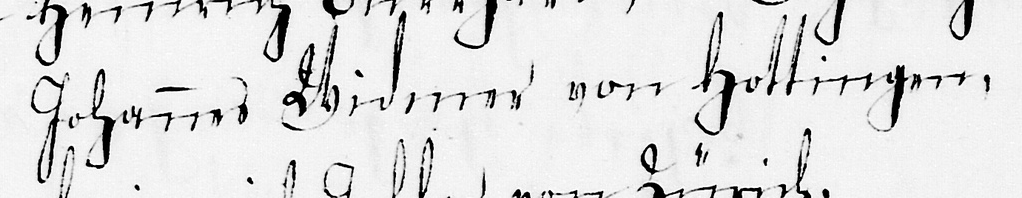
Johannes Widmer von Hottingen,
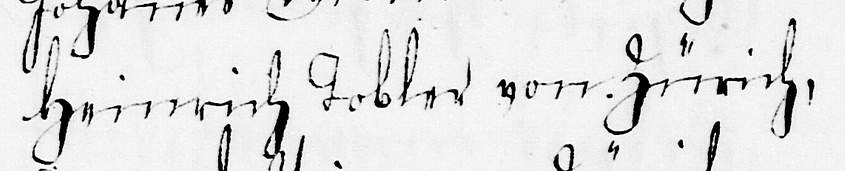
Heinrich Tobler von Zürich,
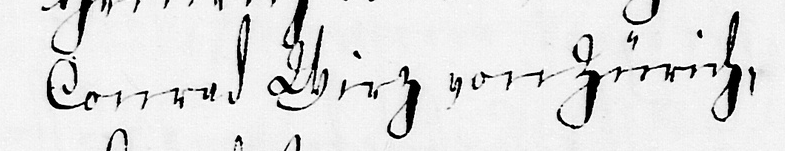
Conrad Wirz von Zürich,
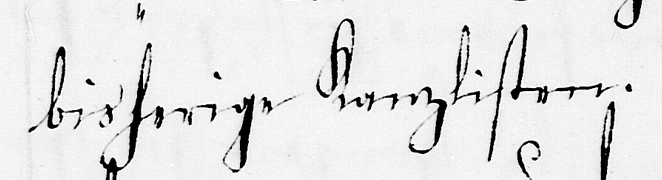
bisherige Kanzlisten.
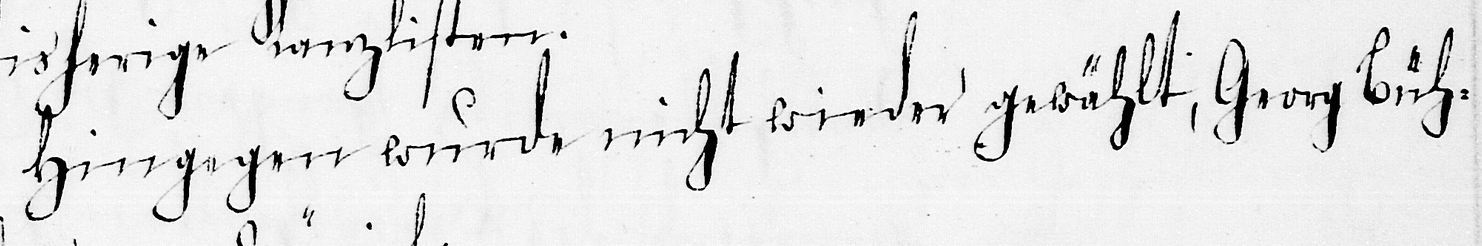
Hingegen wurde nicht wieder gewählt, Georg Büh¬
